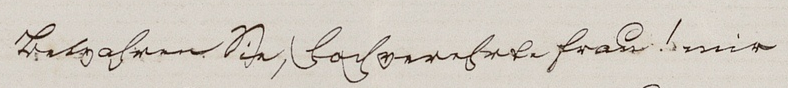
Bewahren Sie, hochverehrte Frau! mir
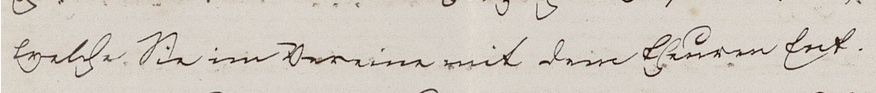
welche Sie im Vereine mit dem theuren Ent-
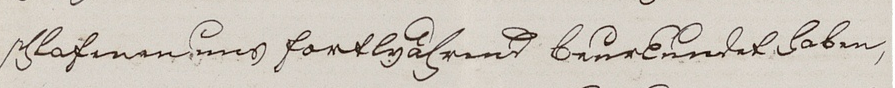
schlafenen uns fortwährend beurkundet haben,
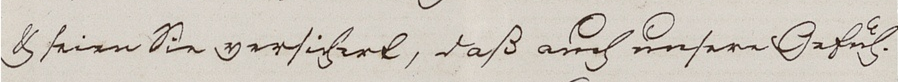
& seien Sie versichert, daß auch unsere Gefüh-
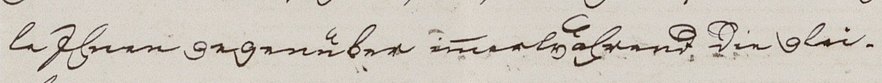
le Ihnen gegenüber immerwährend die glei-
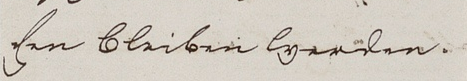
chen bleiben werden.
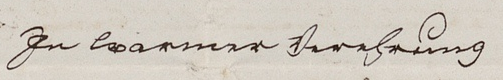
In warmer Verehrung
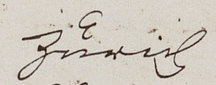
Zürich
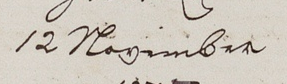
12 November
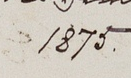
1875.
